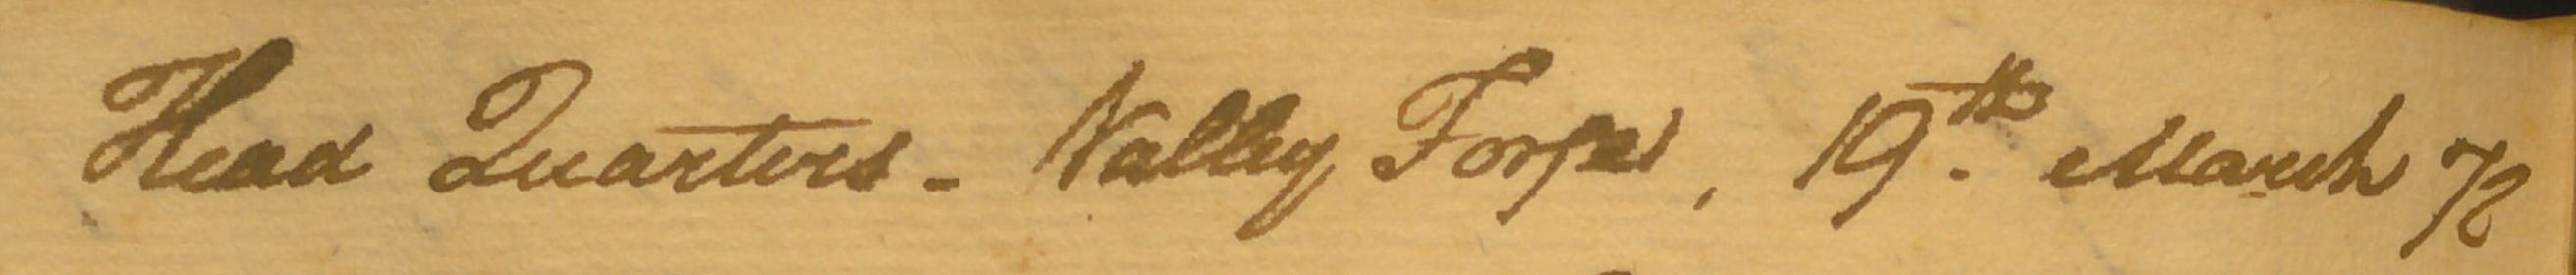Head Quarters. Valley Forge. 19^th. March 78
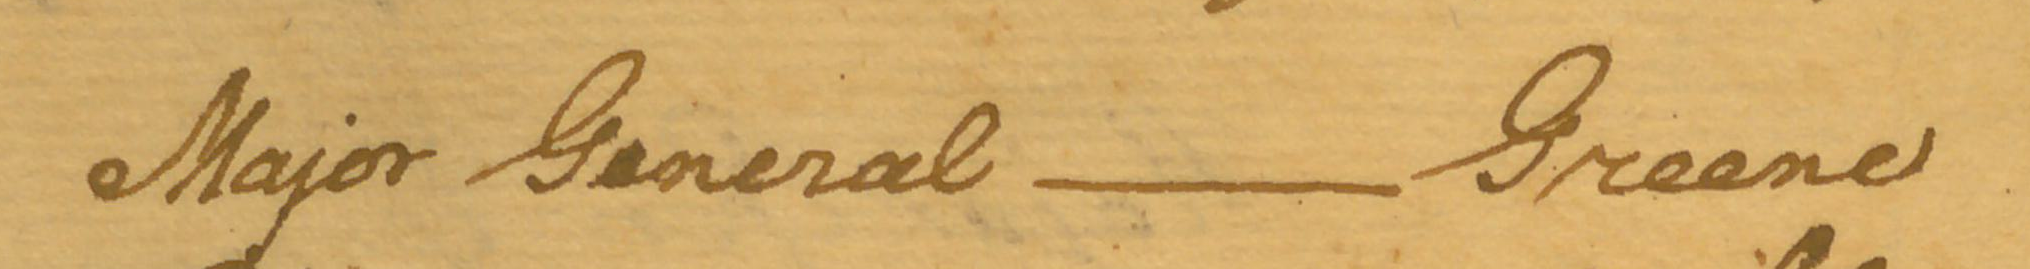Major General- Greene
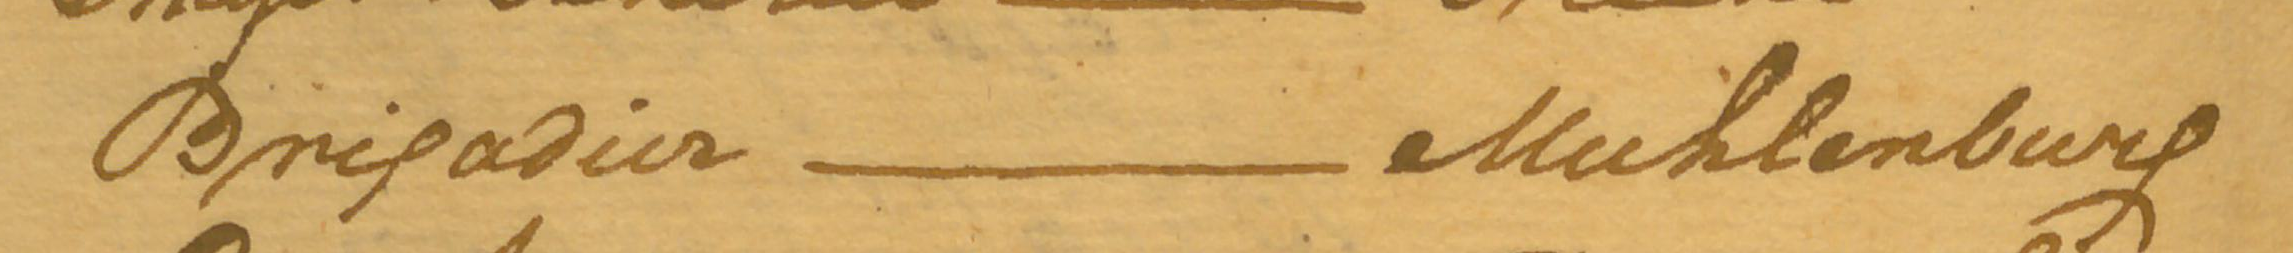Brigadier- Muhlenburg
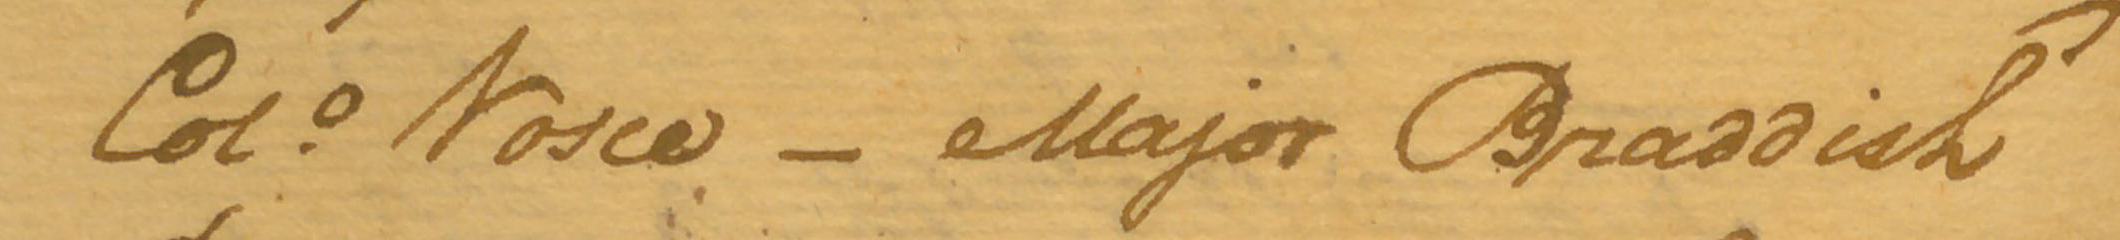Col^o. Vosce- Major Braddish
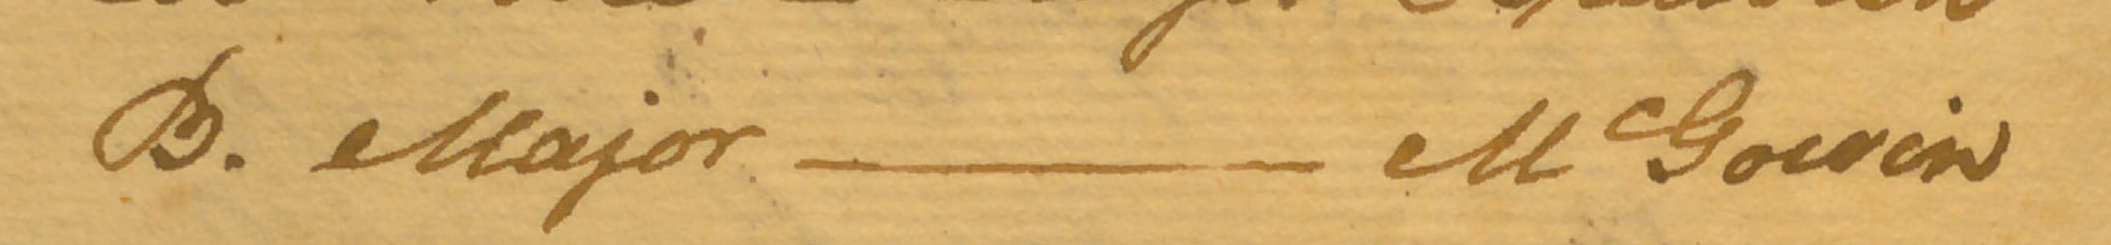B. Major- M^cGowin
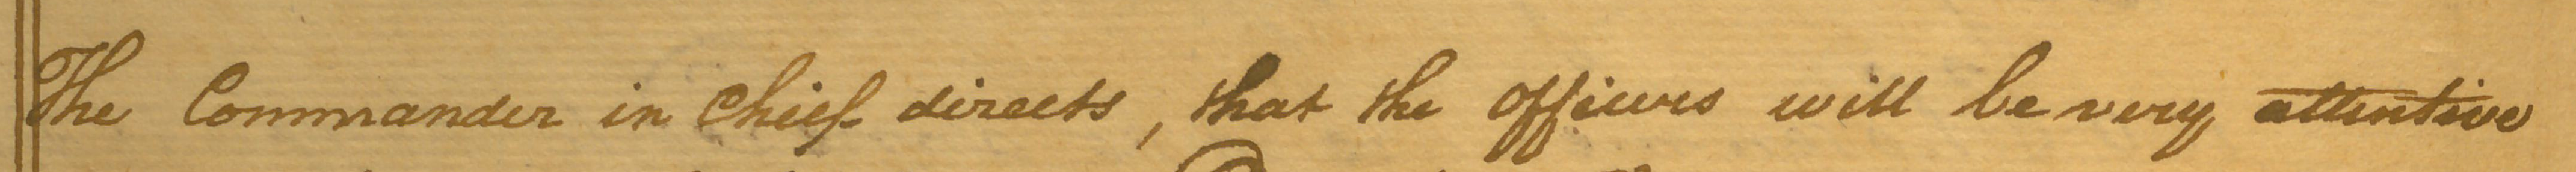The Commander in Chief directs, that the officers will be very attentive
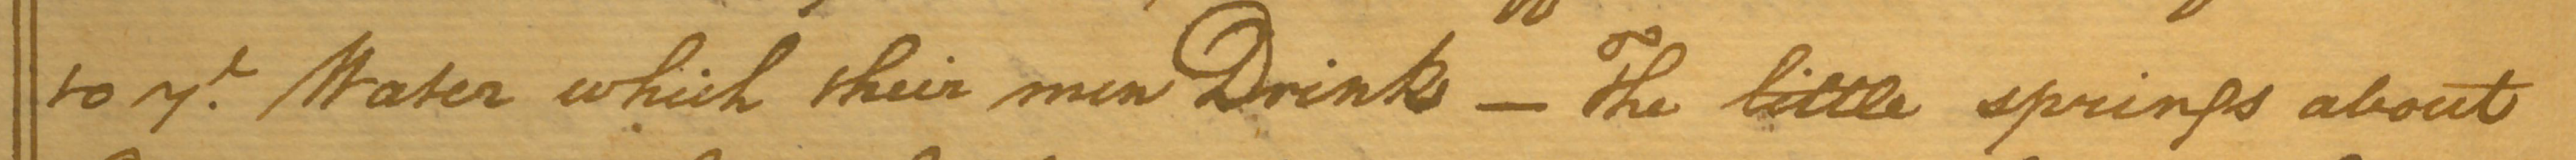to y^e. Water which their men Drink- The little springs about
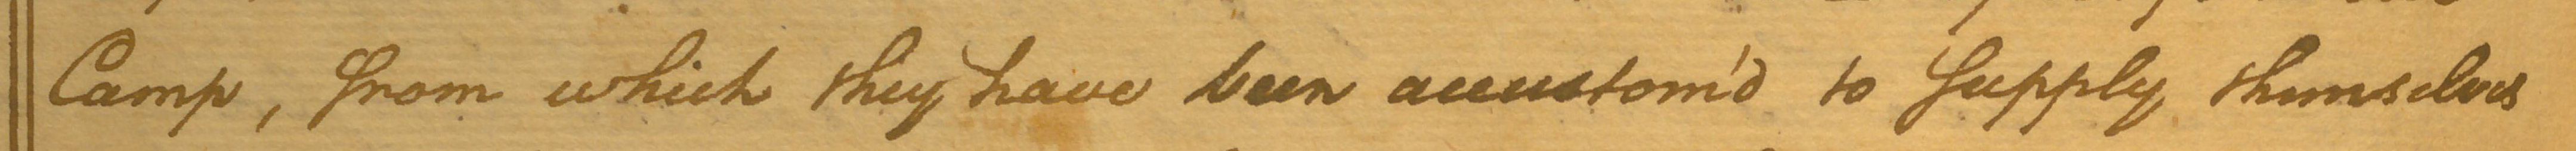Camp, from which they have been accustom'd to supply themselves
